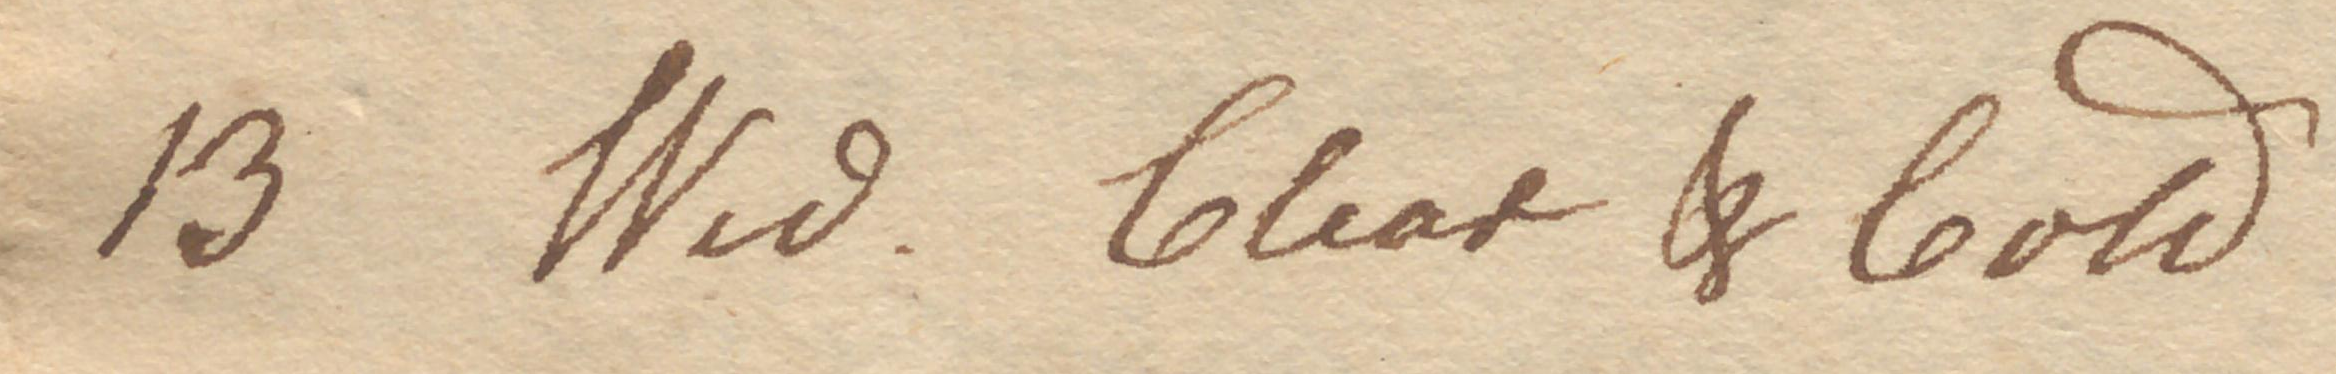13 Wed. Clear & Cold
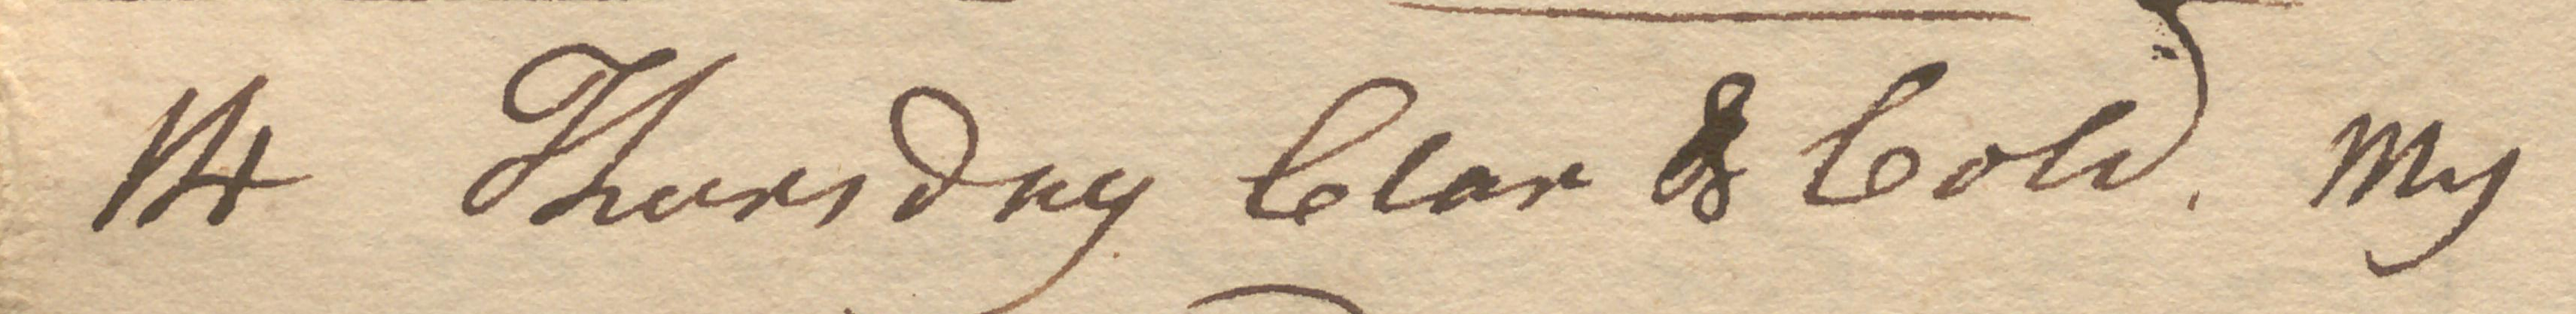14 Thursday Clar & Cold. My
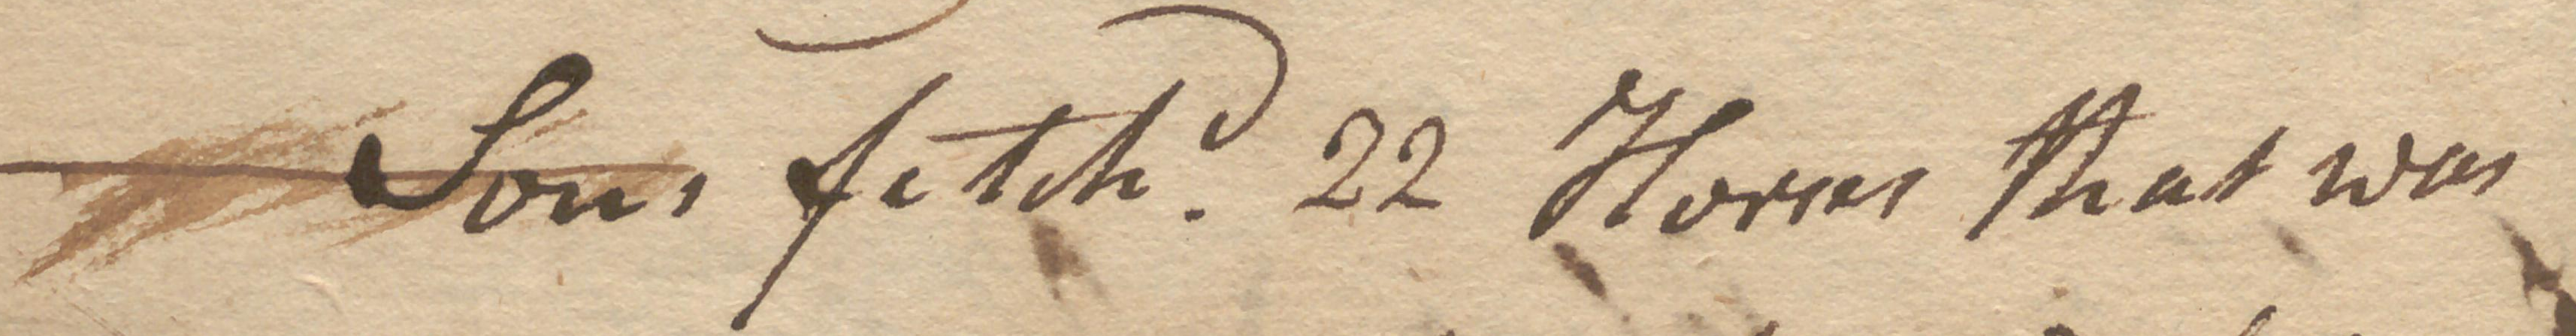Sons fetch^d. 22 Horses that was
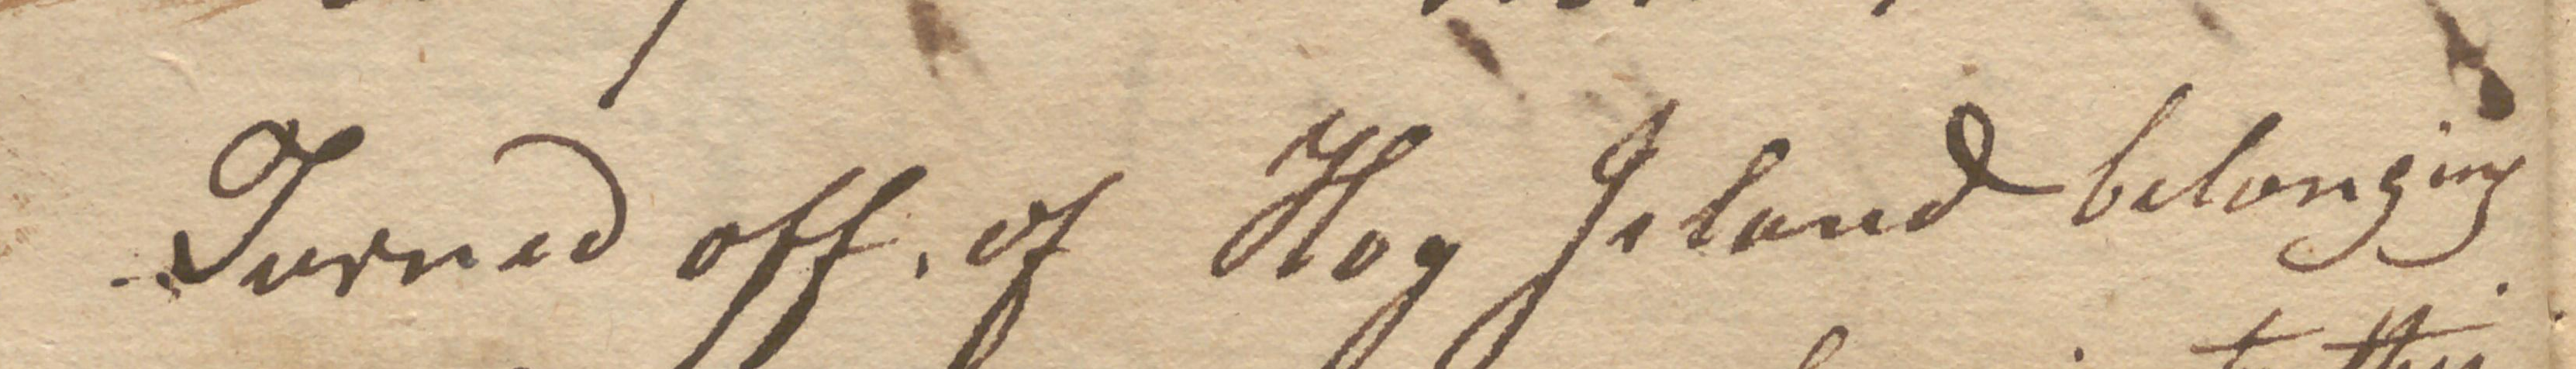Turned off of Hog Island belonging
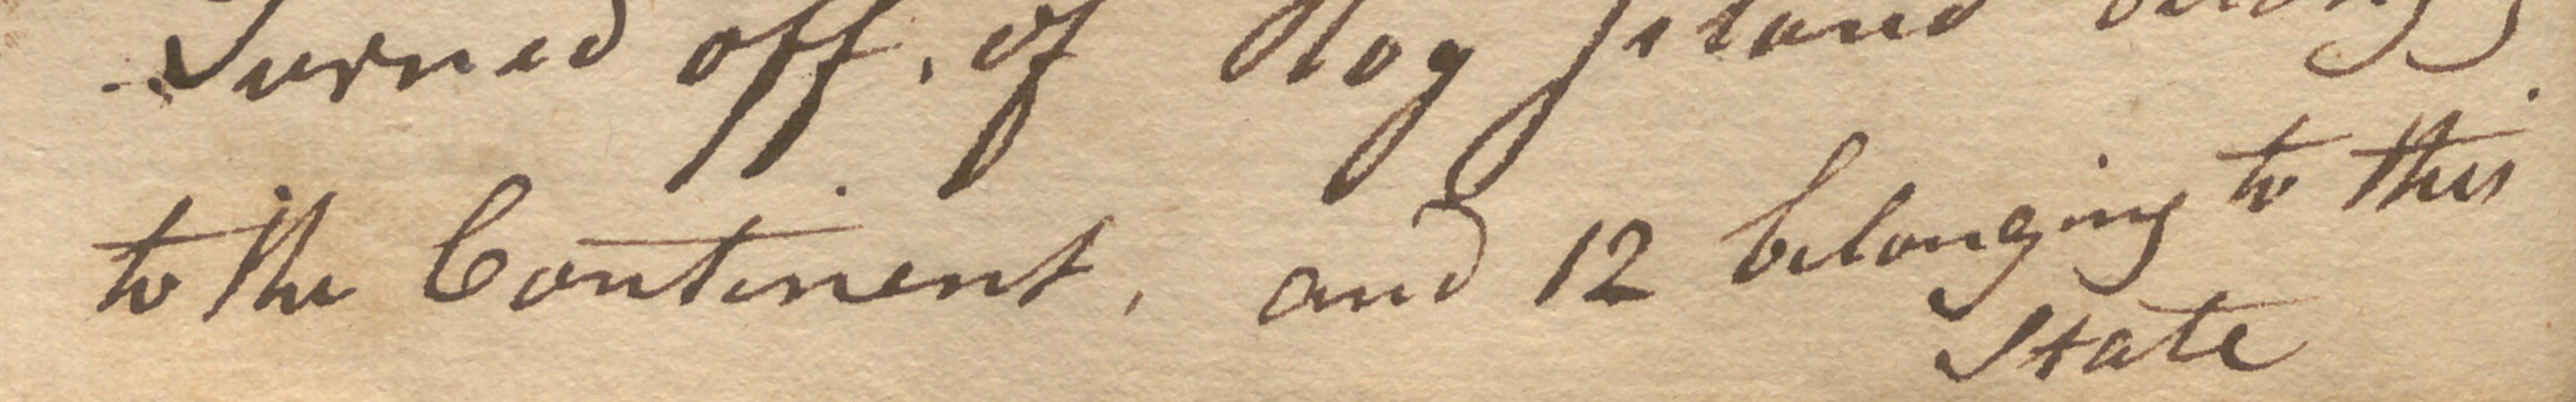to the Continent, and 12 belonging to this
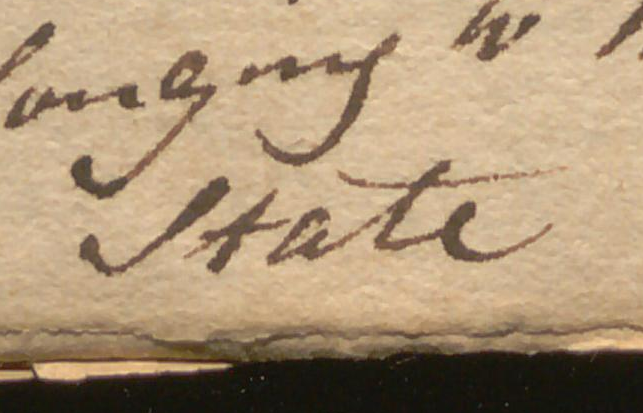State
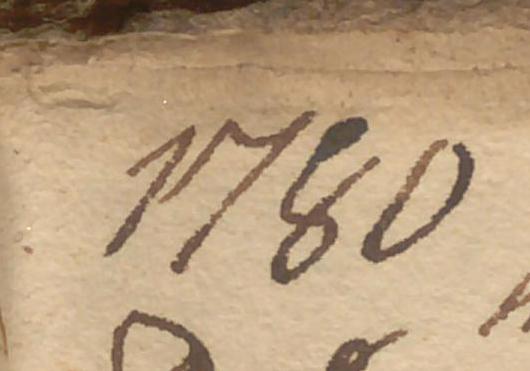1780
